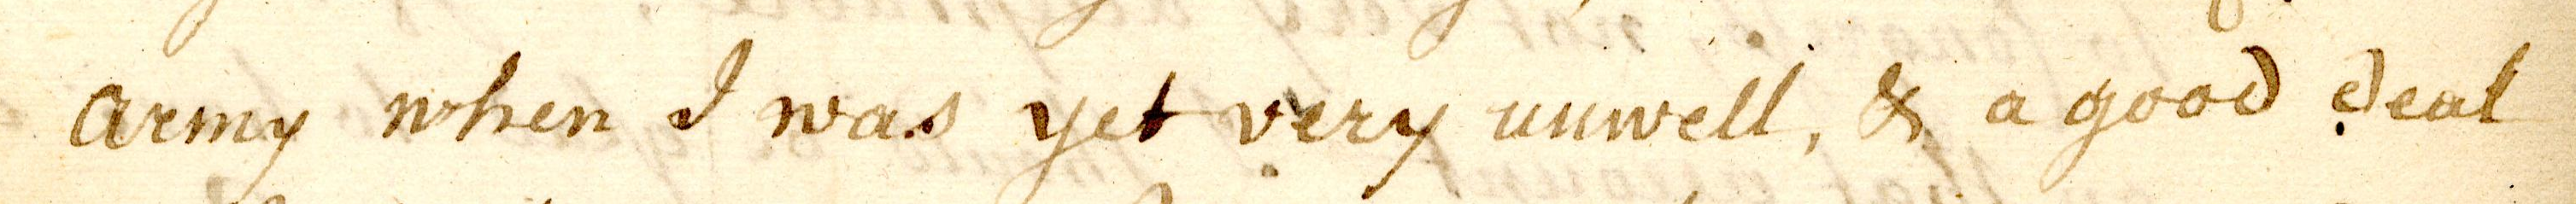Army when I was yet very unwell & a good deal
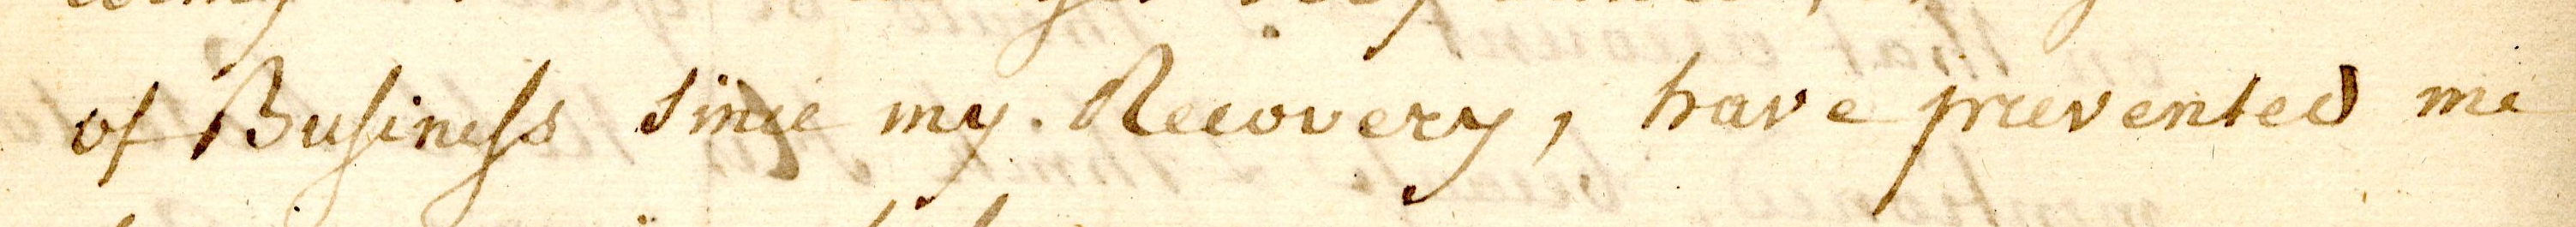of Business since my Recovery, have prevented me
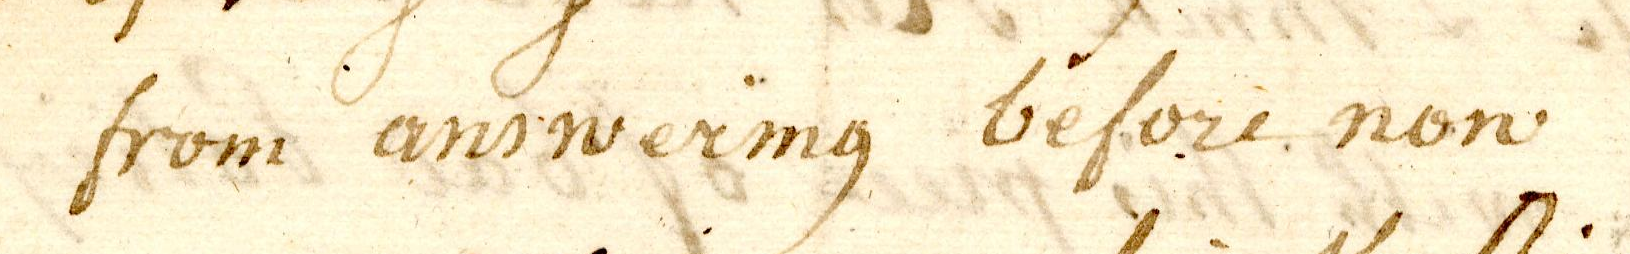from answering before now
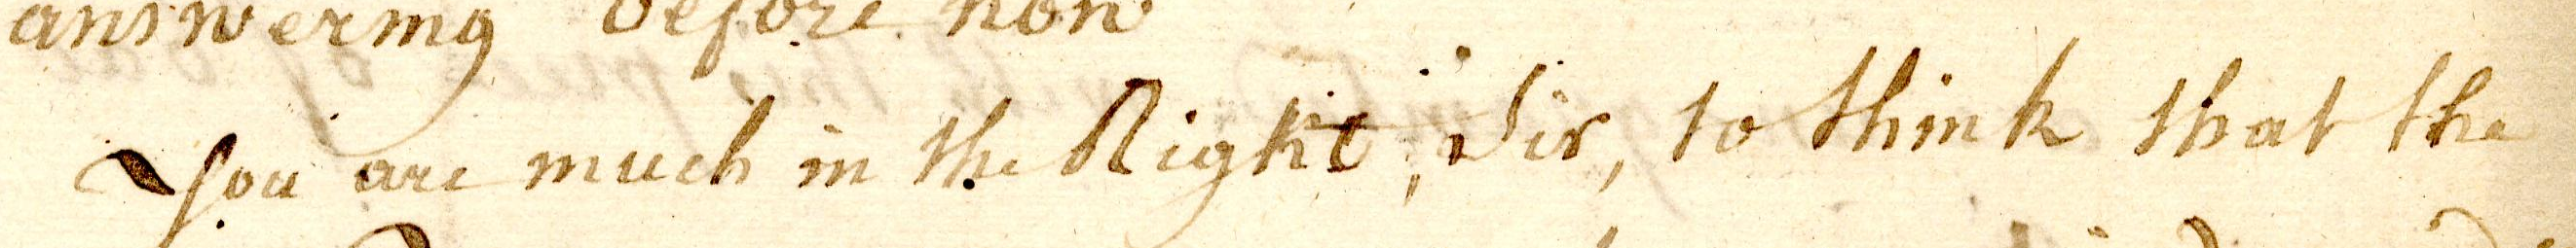You are much in the Right Sir, to think that the
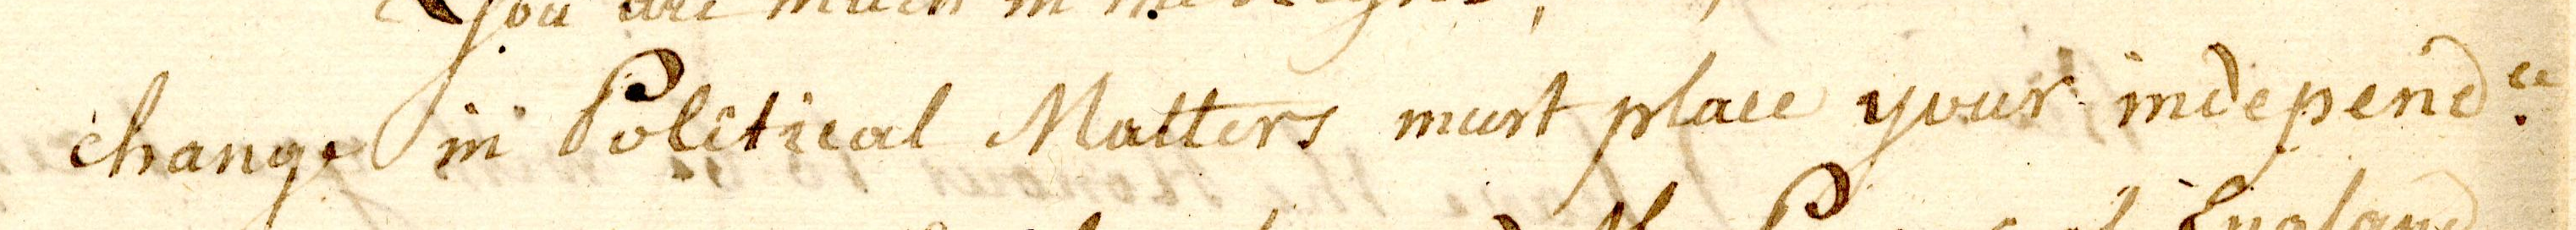change in Political Matters, must place your independ^ce.
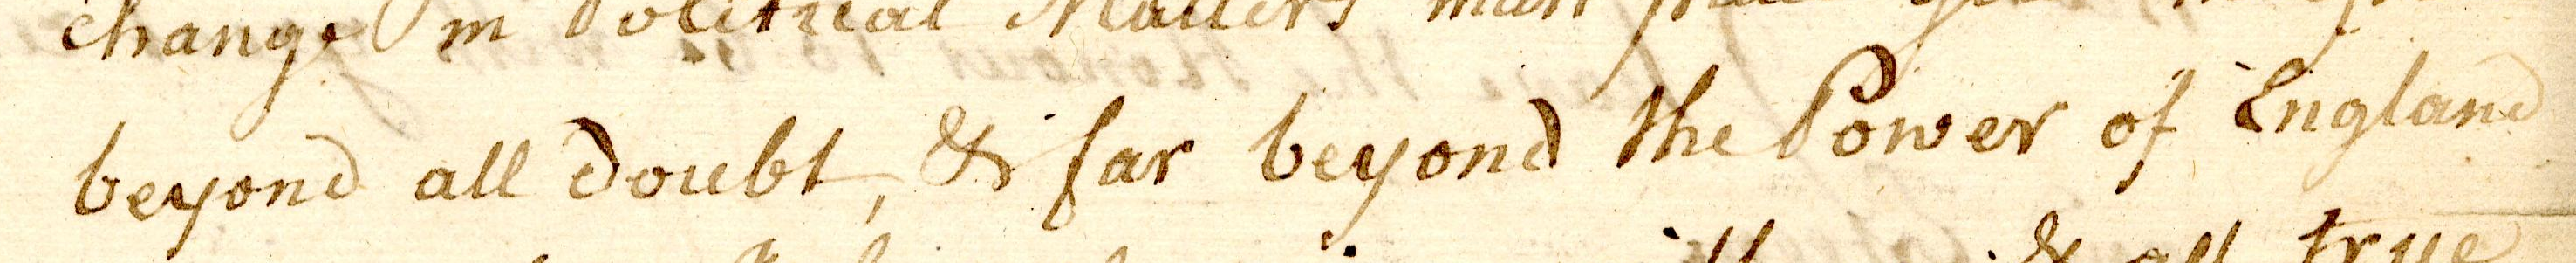beyond all doubt, & far beyond the Power of England
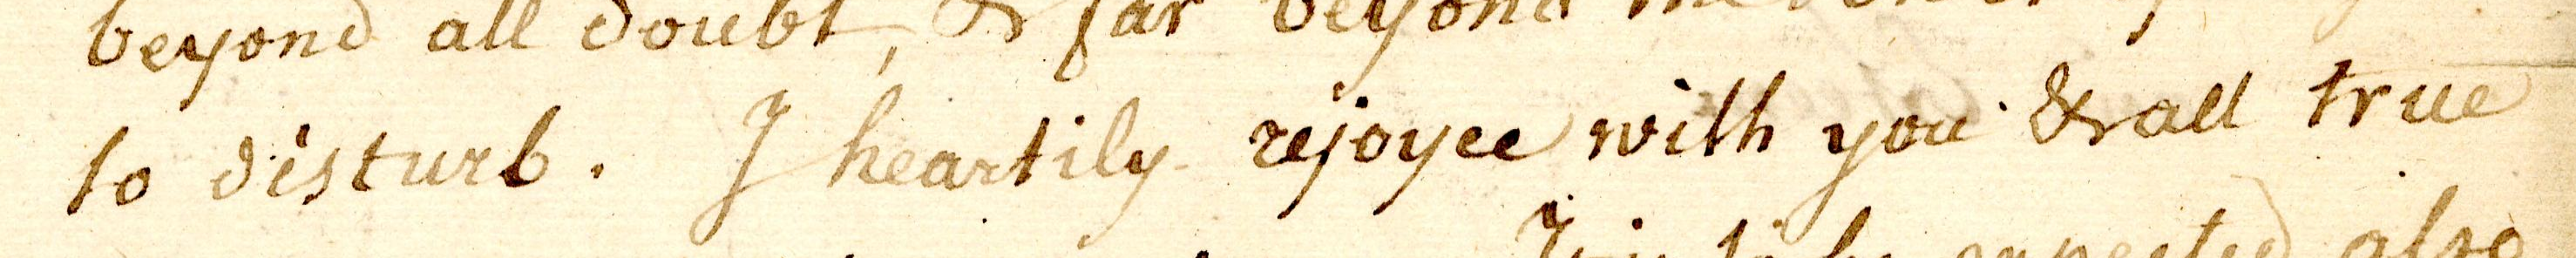to disturb. I heartily rejoyce with you & all true
